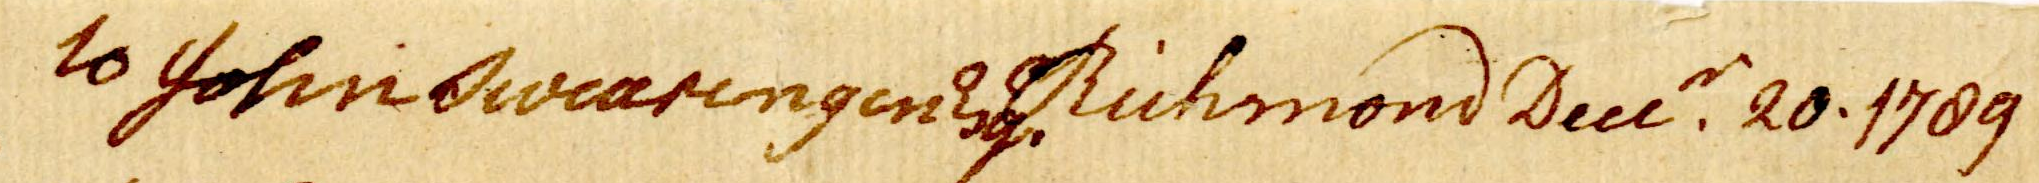to John Seveargen Esqr Richmond Dece^r. 20th 1789
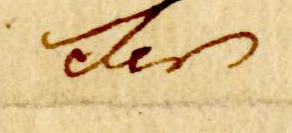Ser
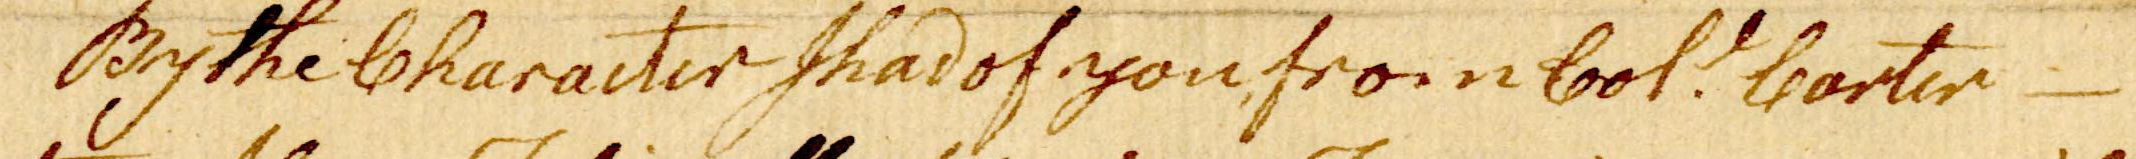By the Character I had of you from Col^o. Carter-
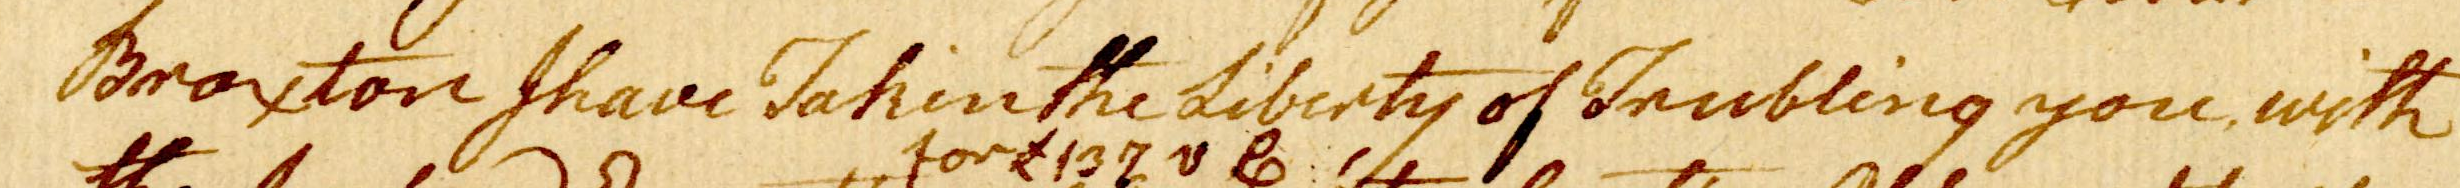Braxton I have Taken the Liberty of troubling you with
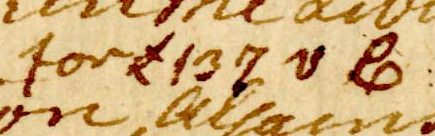for £13706
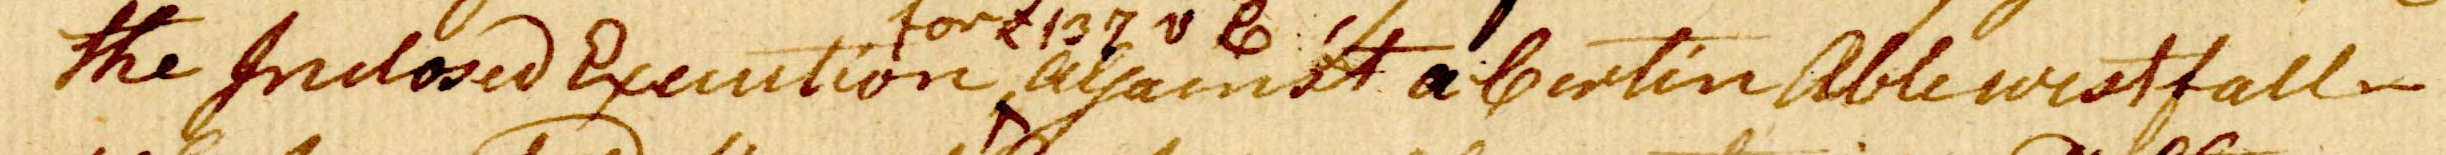the Inclosed Execution ^ against a Certin Able Westfall
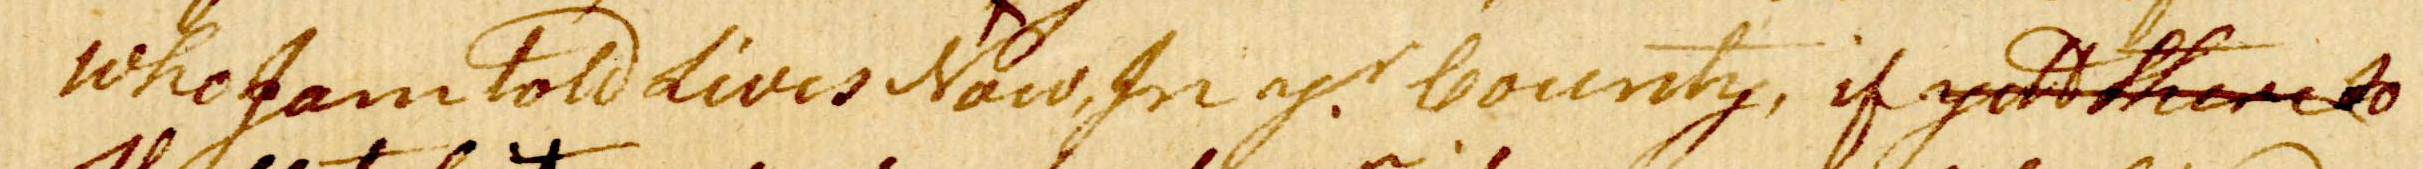who I am told Lives Now. In y^r. County, if [sold there to]
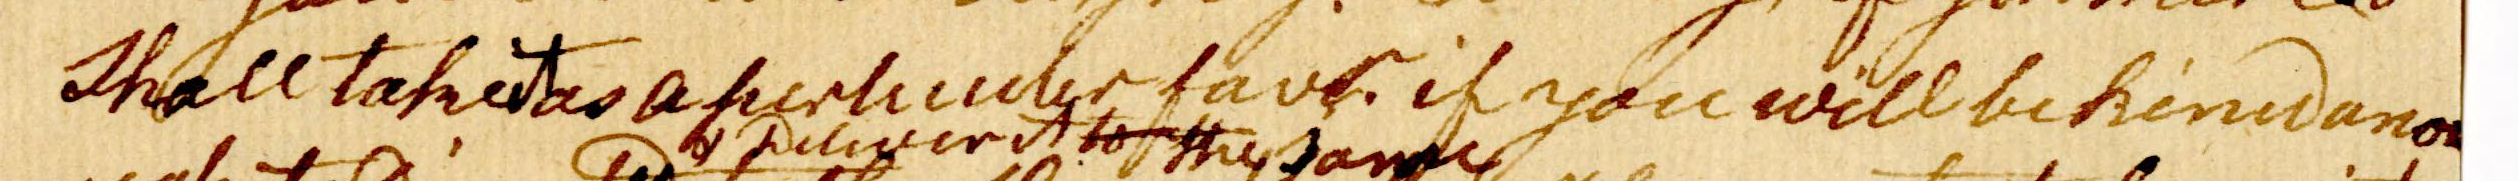Shall take as a particular, fav^r if you will be kind ano-
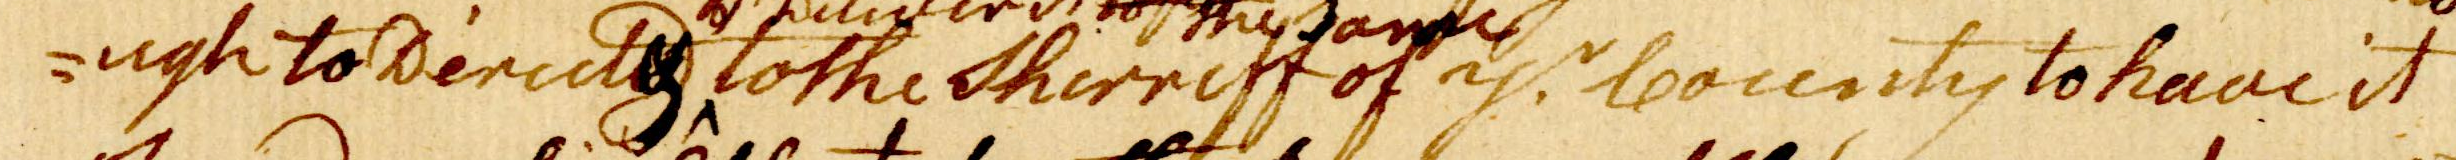-ugh to direct[__] ^ to the Sherriff of y^e. County to have it
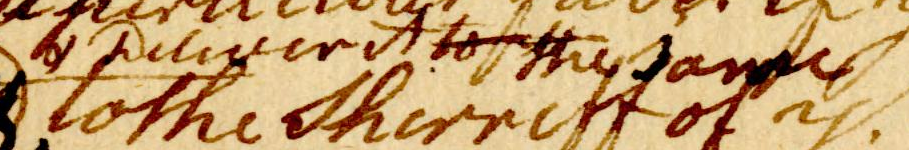& Deliver it to the same
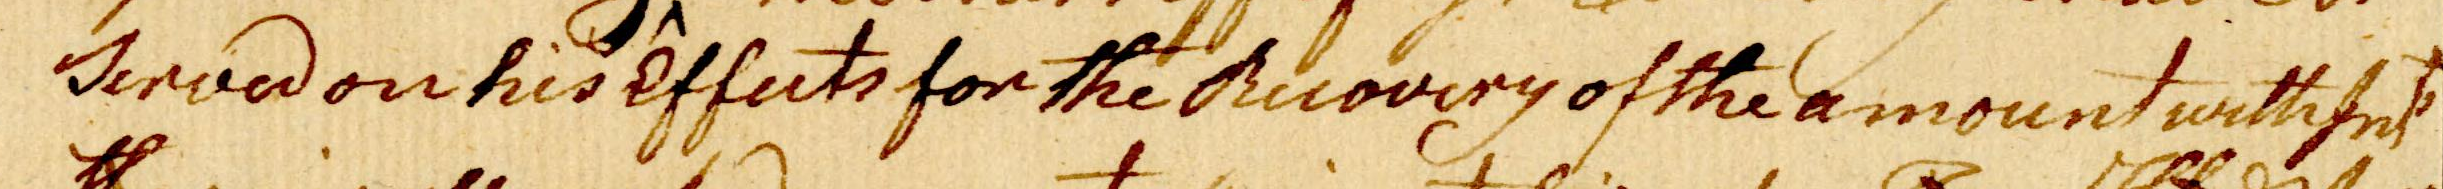Served on his Effects for the Recovery of the amount with inc^d
